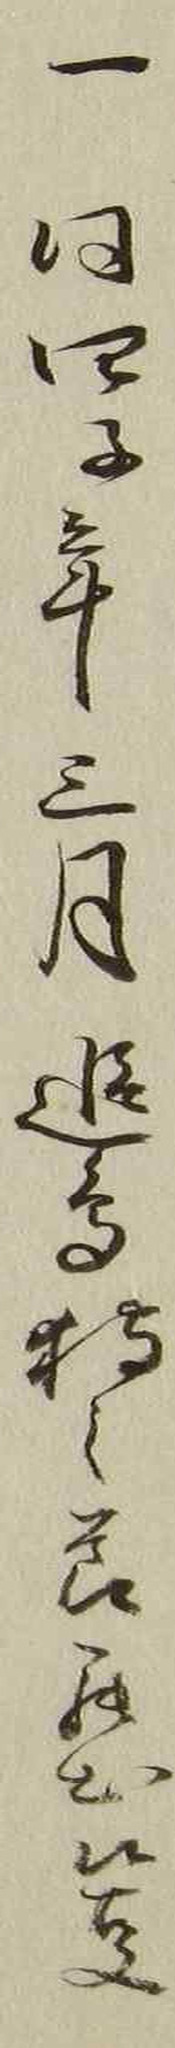一同四子年三月追鳥狩之節罷出候事
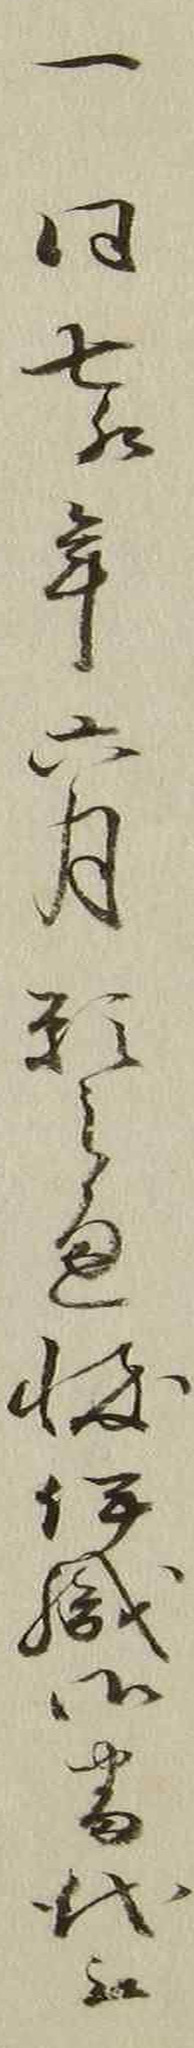一同七卯年六月願之通忰伊織御番代被
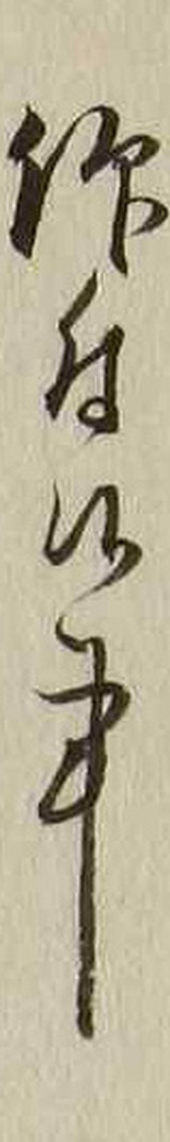仰付候事
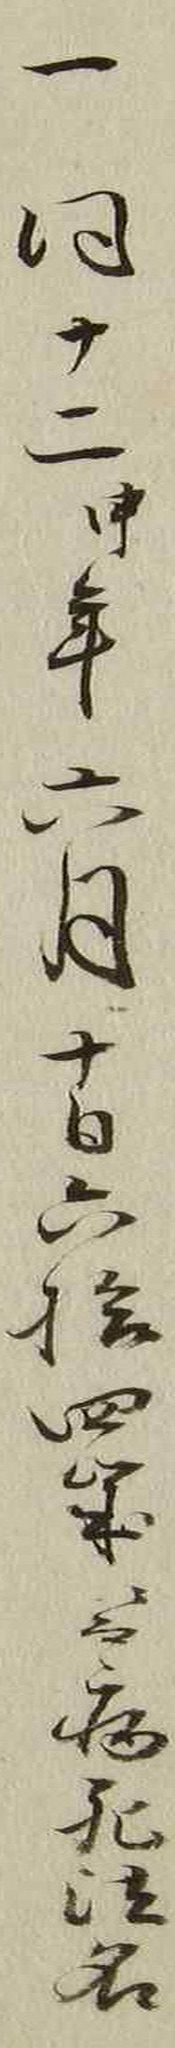一同十二申年六月十日六拾四歳ニ而病死法名
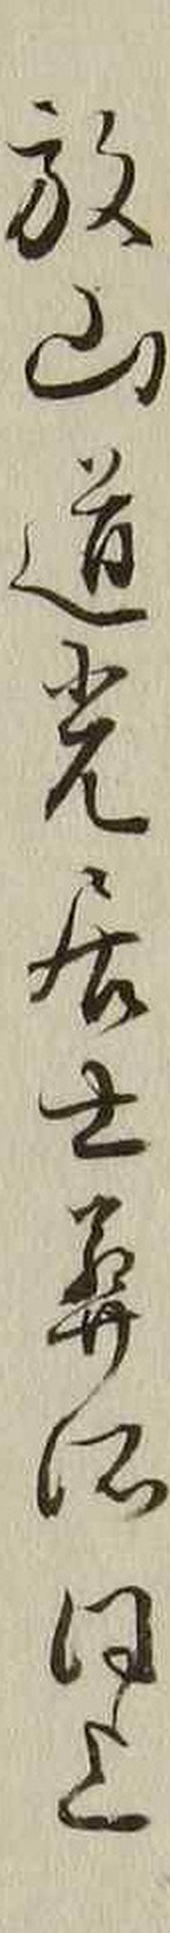放山道光居士葬所同上
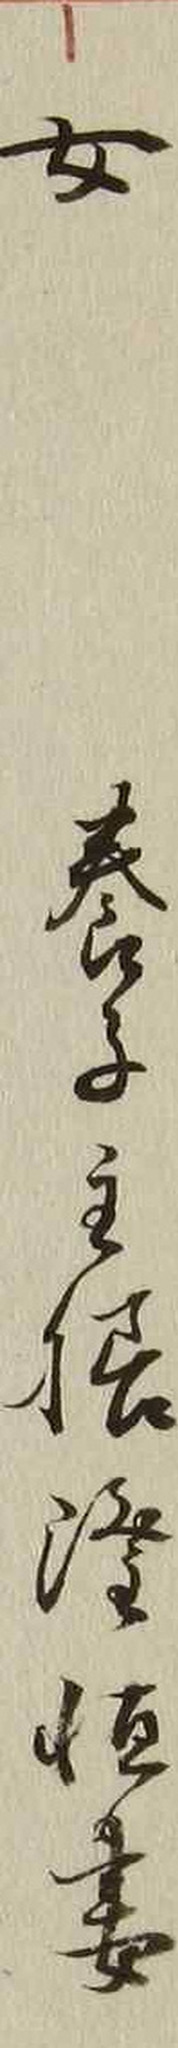女養子主膳隆恒妻
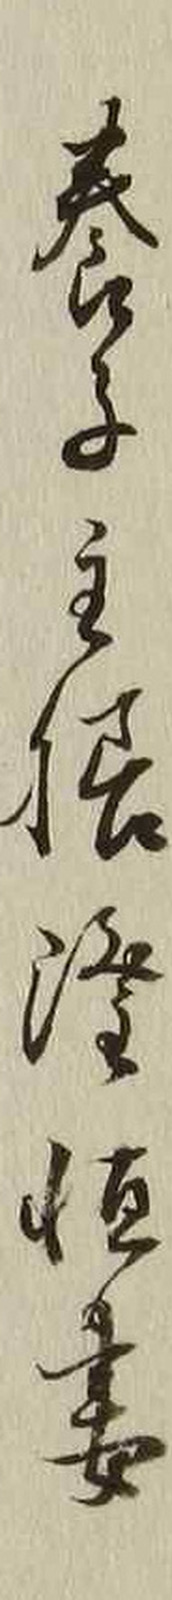女養子主膳隆恒妻
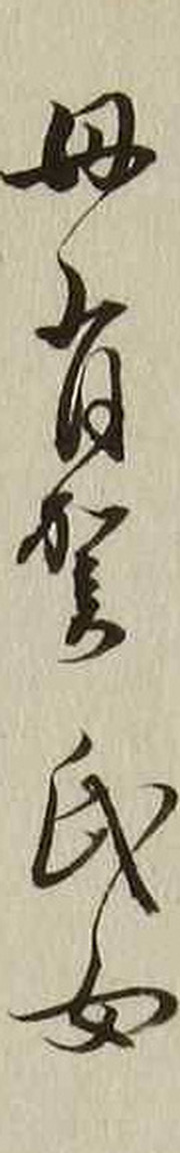母有賀氏女
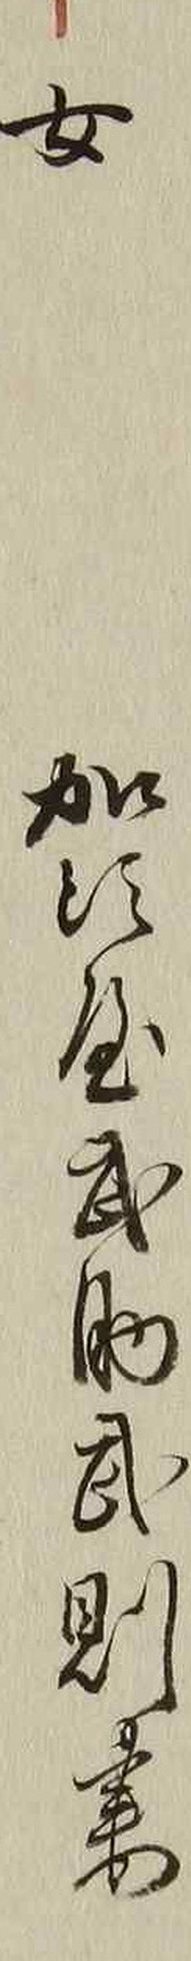女加須屋武助武則妻
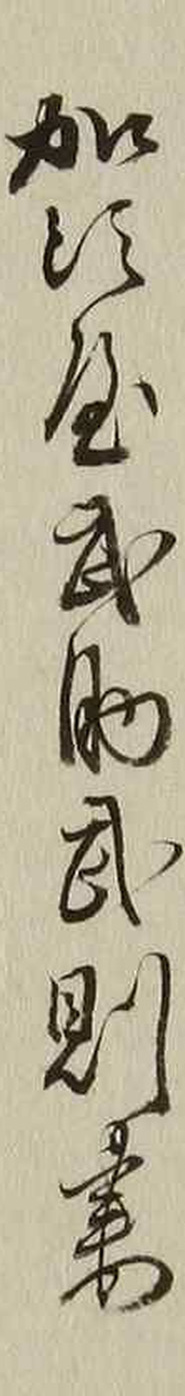女加須屋武助武則妻
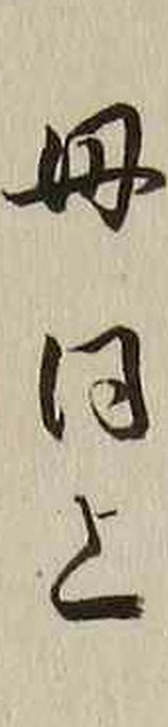母同上
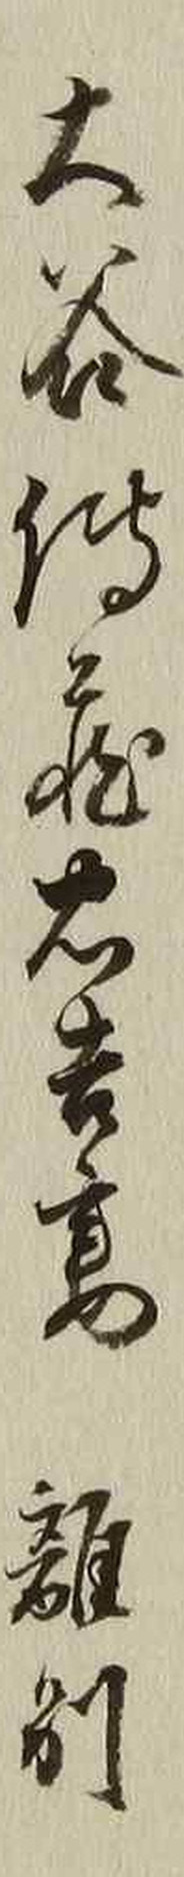女大谷伝蔵右吉妻離別
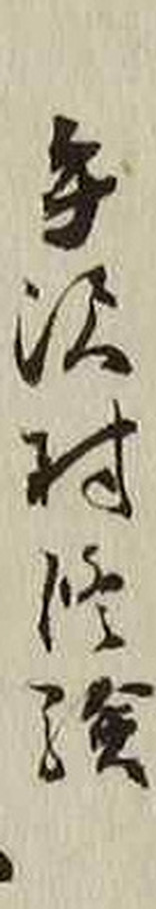手沢村修験
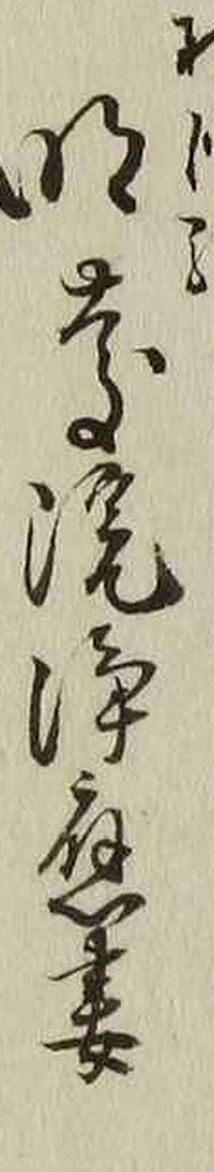明慶院浄応妻
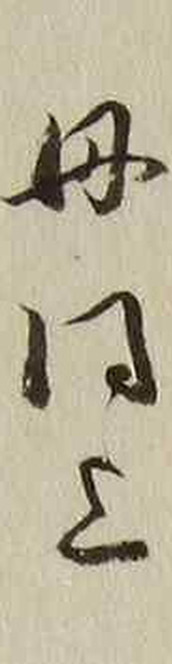母同上
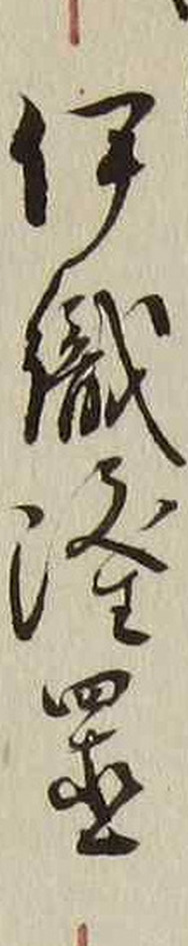伊織隆置
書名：諸士系譜　巻之26　い之部26
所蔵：会津若松市立会津図書館
